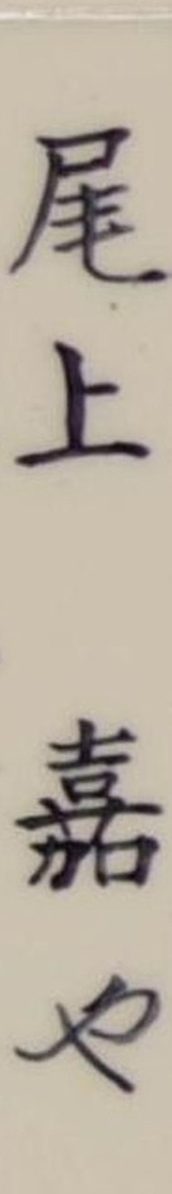尾上嘉や
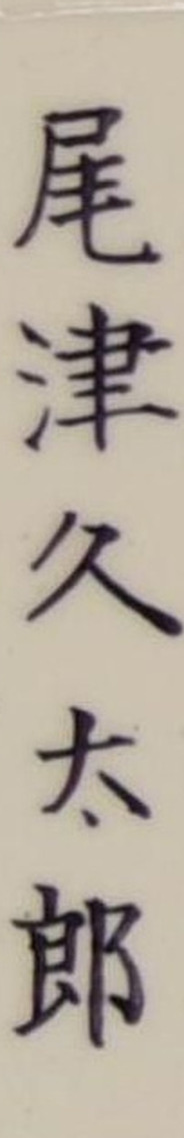尾津久太郎
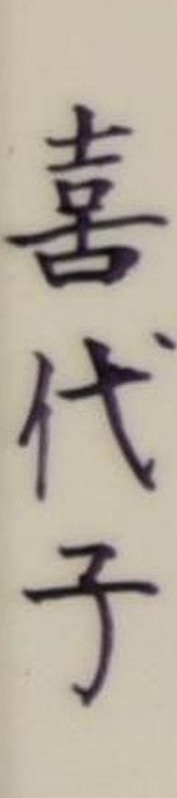喜代子

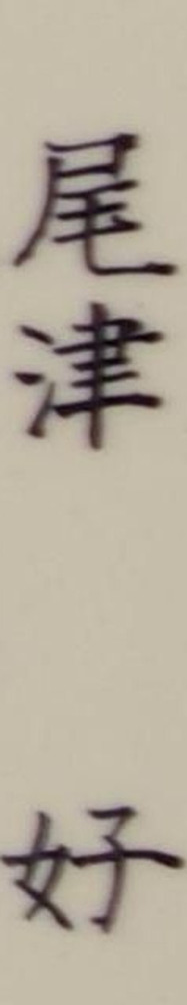尾津好
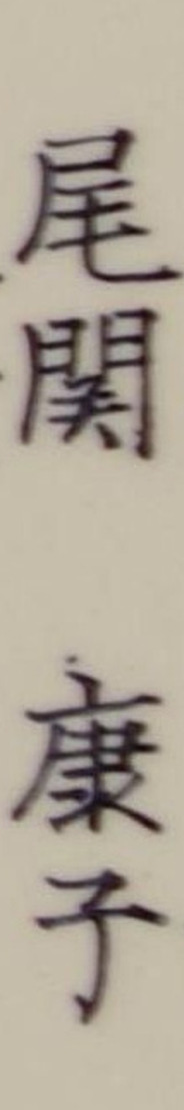尾関康子
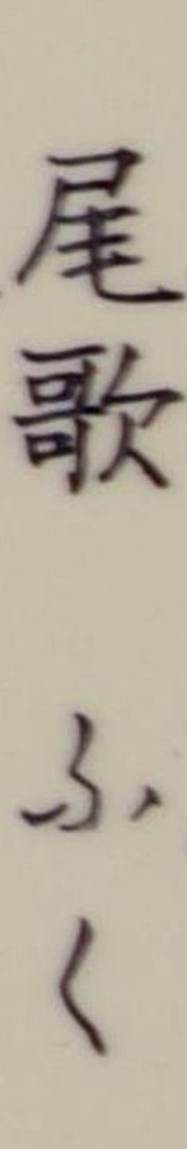尾歌ふく
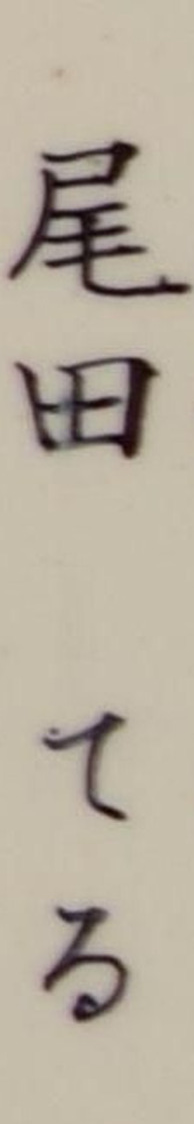尾田てる
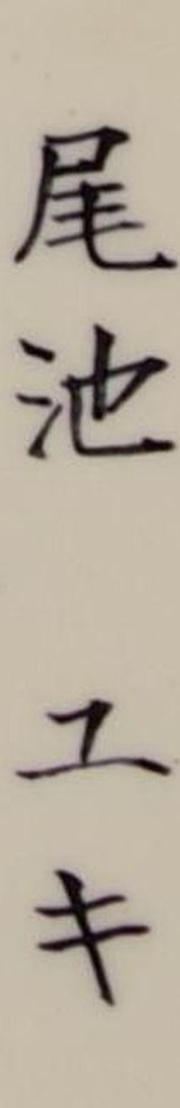尾池ユキ
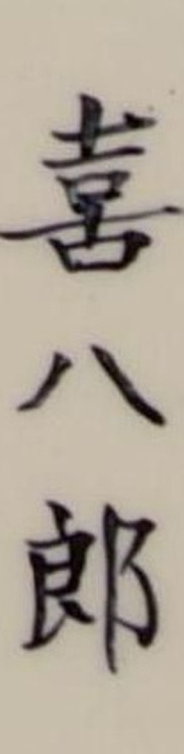喜八郎
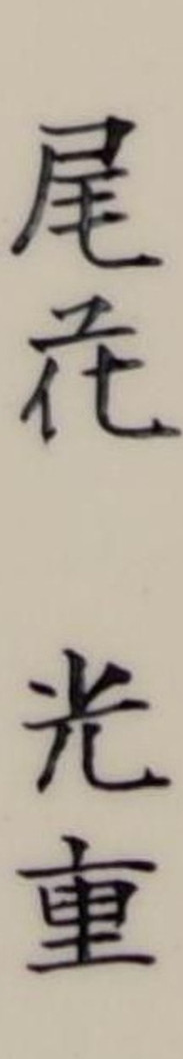尾花光重
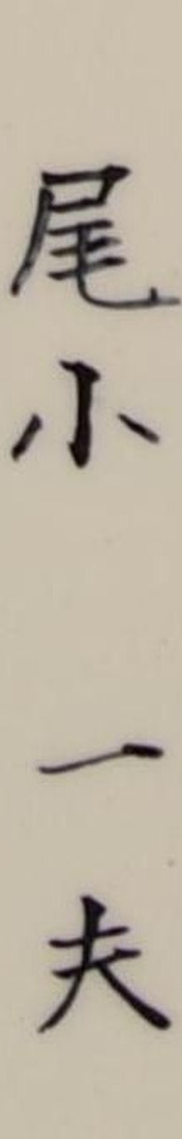尾小一夫
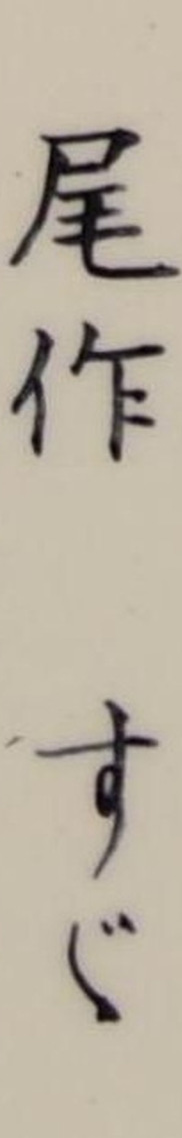尾作すゞ
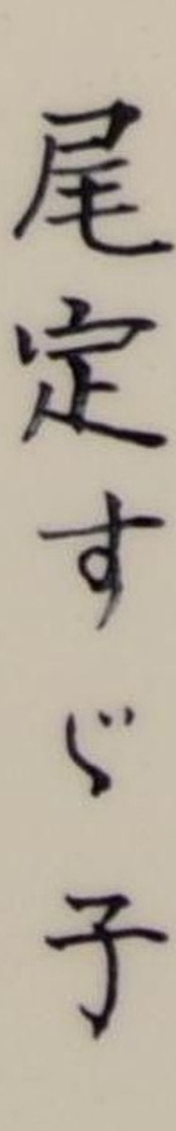尾定すゞ子
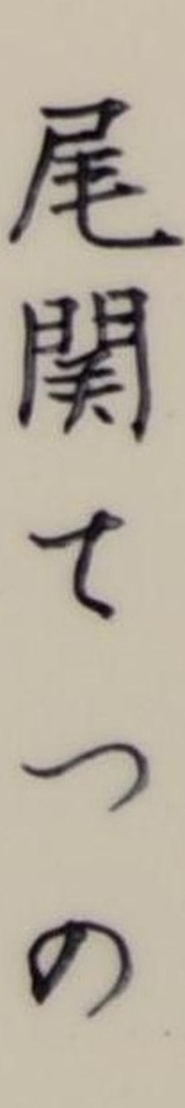尾関てつの
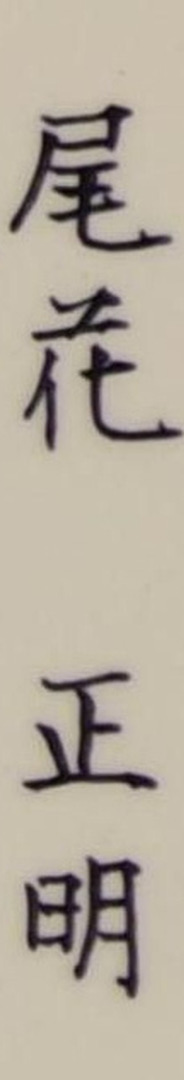尾花正明
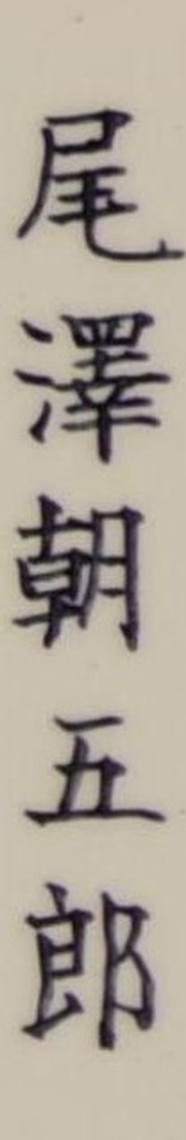尾澤朝五郎
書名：E~L
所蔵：高野山金剛峯寺
